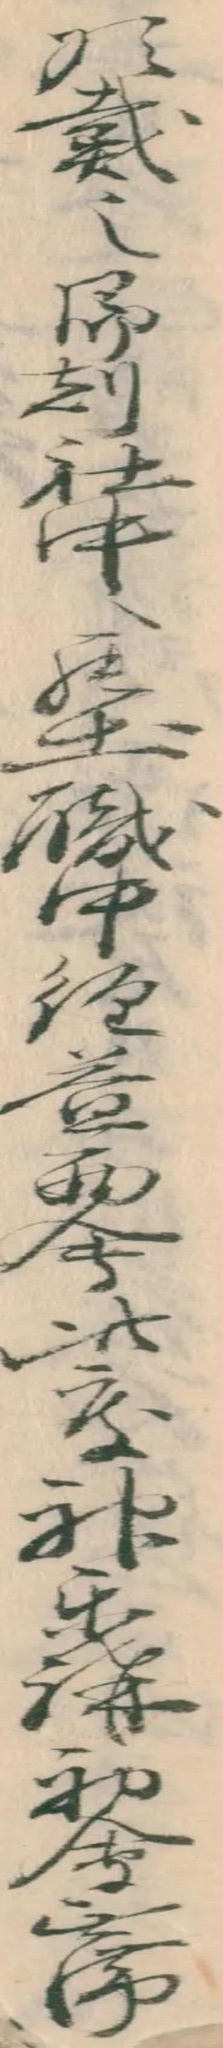頂戴之即刻社中へ罷出職中経益西會此度神楽講初會無滞
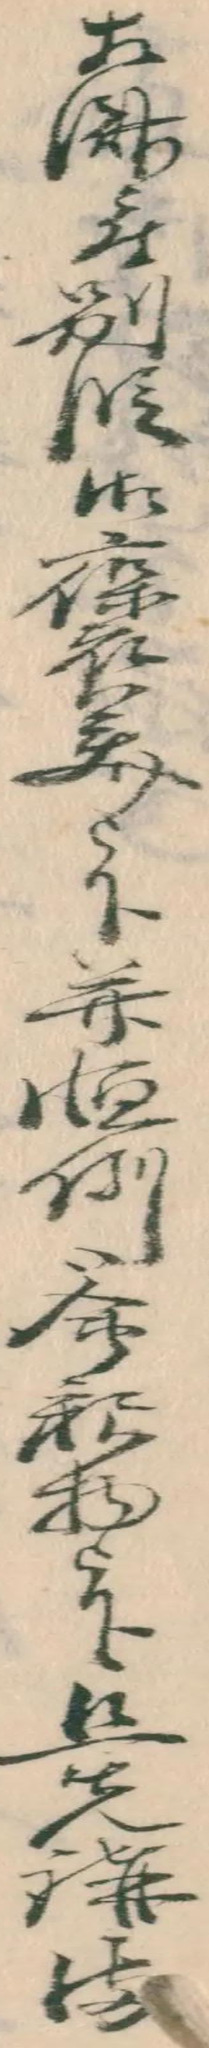相済ニ付別段御褒美被下幷恒例御會釈物被下且先講
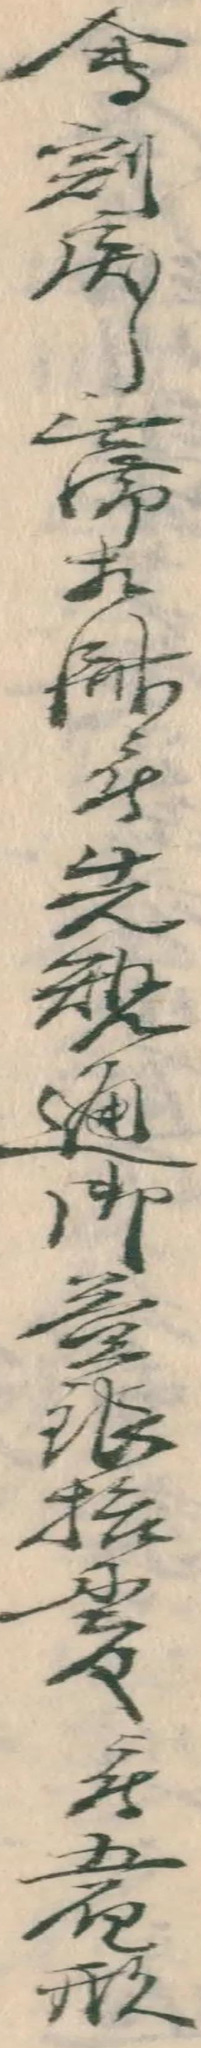會割戻し無滞相済ニ付先規通御益銀拾貫匁ニ付五厘形
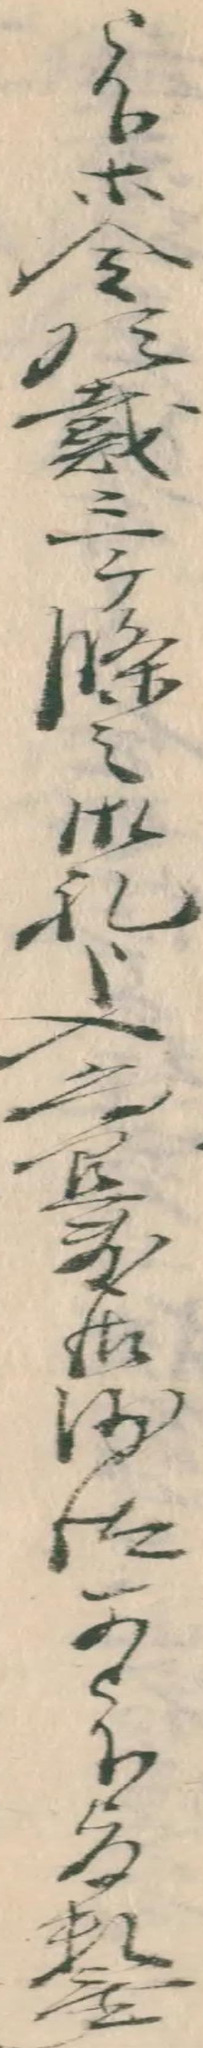被下等金頂戴三ケ條之御礼申入御宜敷御沙汰可被下旨頼置也
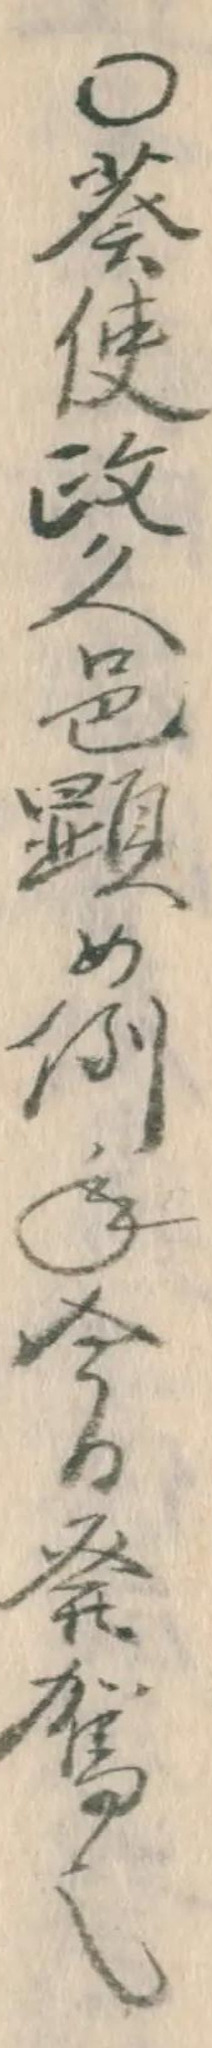○葵使政久邑顕如例年今日発駕也
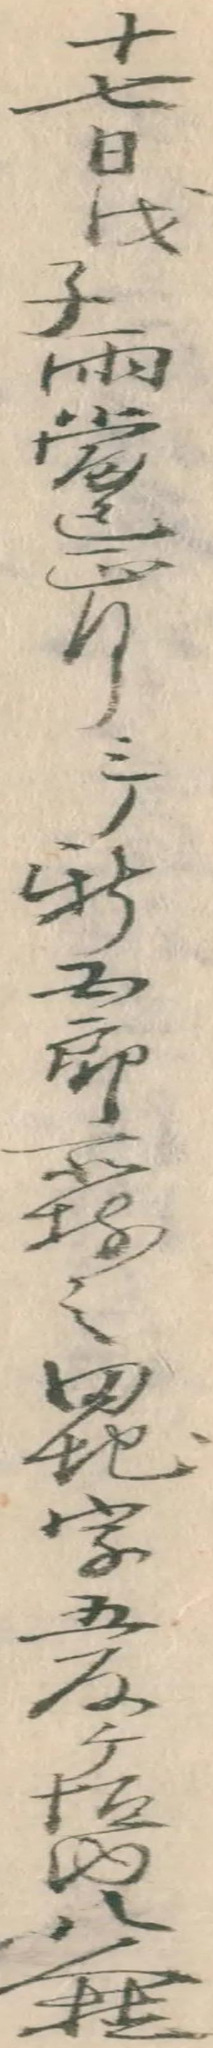十七日戊子雨當巳正月にて新五郎所持之田地字五反ケ垣内八人植
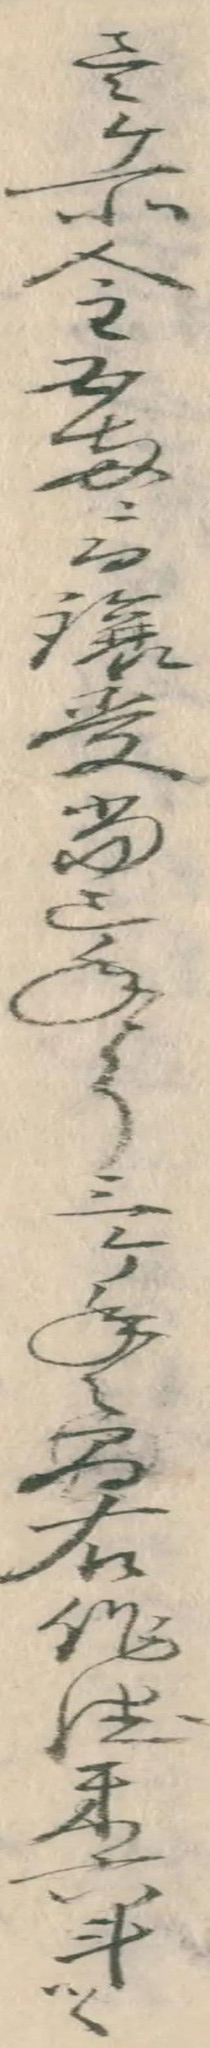壱ケ所金五両ニ而譲受當巳年より三ケ年之間右作徳来六斗ツヽ
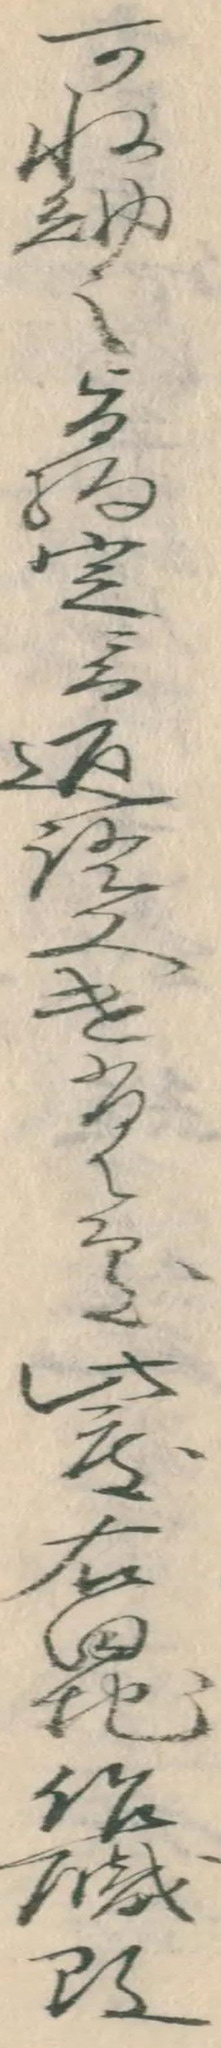可収納之旨約定ニ而返證文遣有之處此度右田地作職改
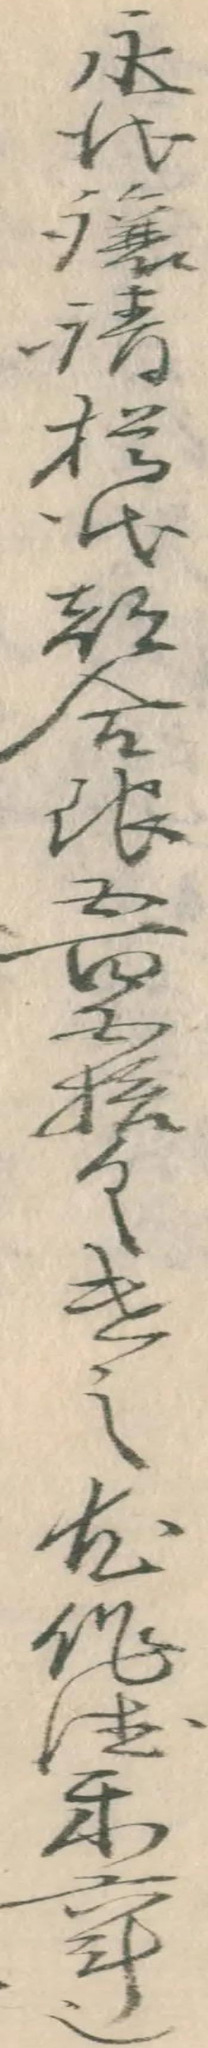永代譲請樽代都合銀五百五拾匁遣也尤作徳米六斗也
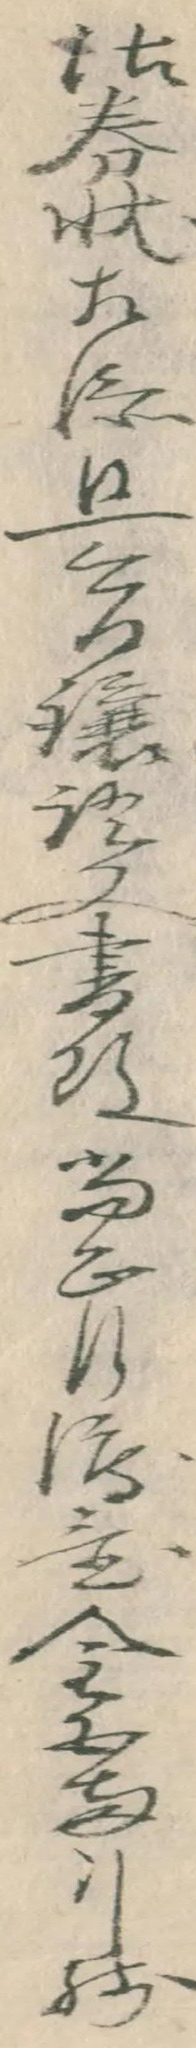沽券状相添且今日譲證文書改當正月渡置金五両引残
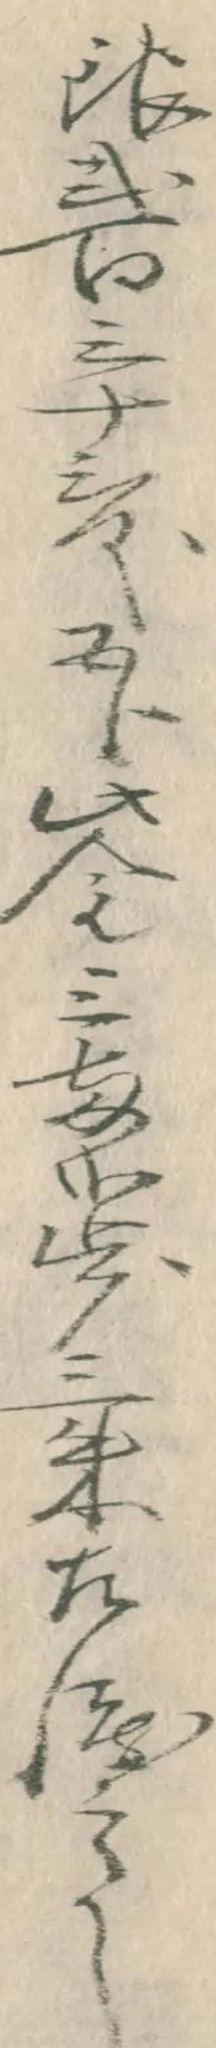銀弐百三十三匁五分此金三両弐歩三朱左渡之了
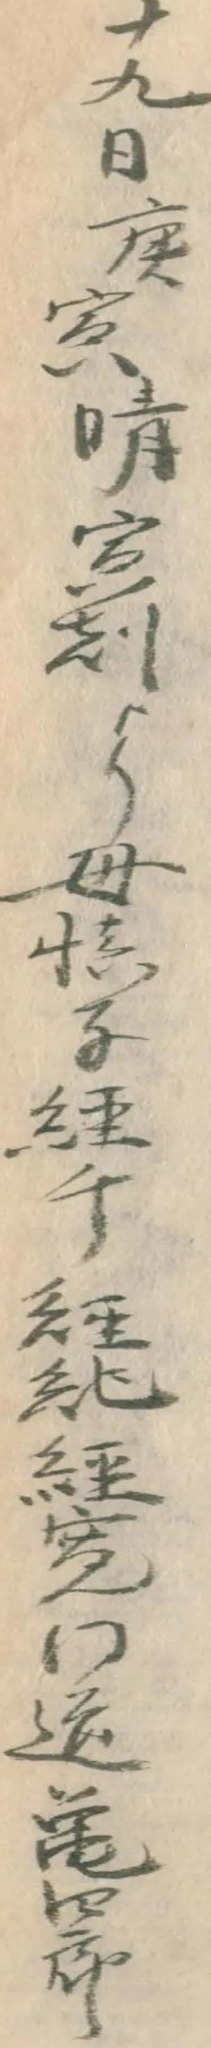十九日庚寅晴寅刻より母慎子経千経紀経寛同道亀四郎

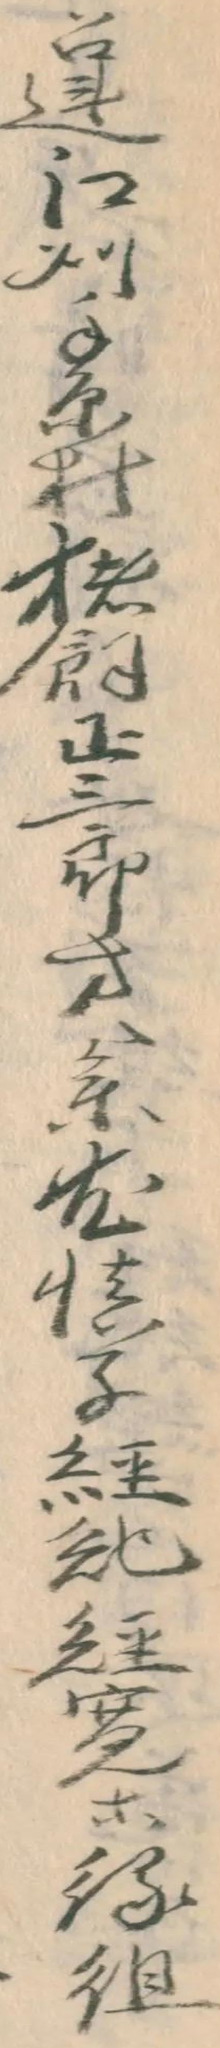召連江州手原村猪飼正三郎方へ参尤慎子経紀経寛等縁組
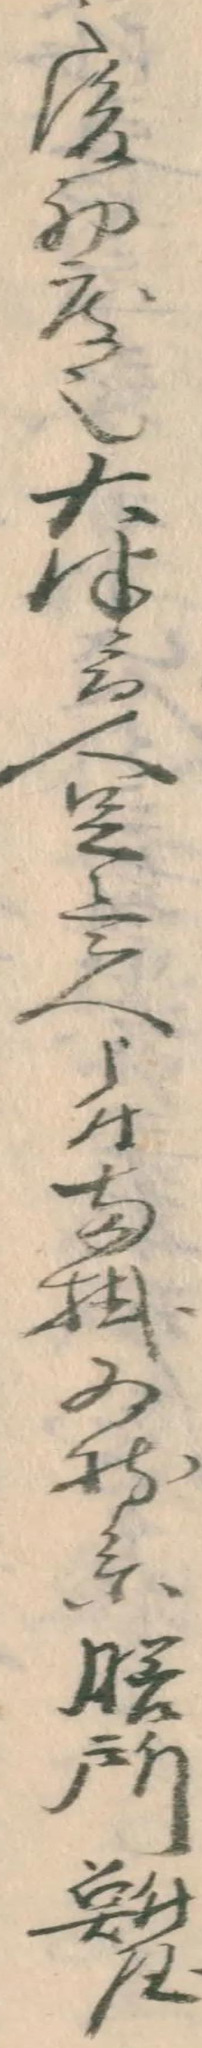之後初度也大津ニ而人足壱人申付両掛為持参膳所鮒屋
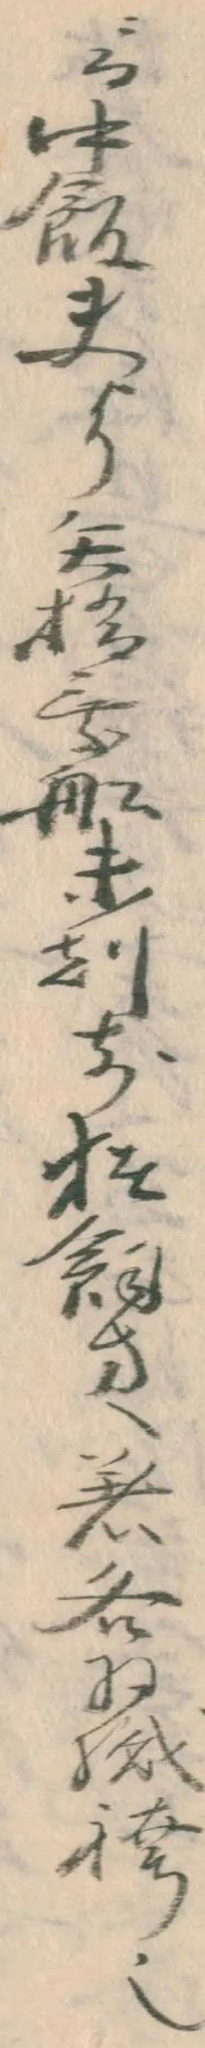二而中飯夫より矢橋乗舩未刻前程猪飼方へ着各羽織袴也
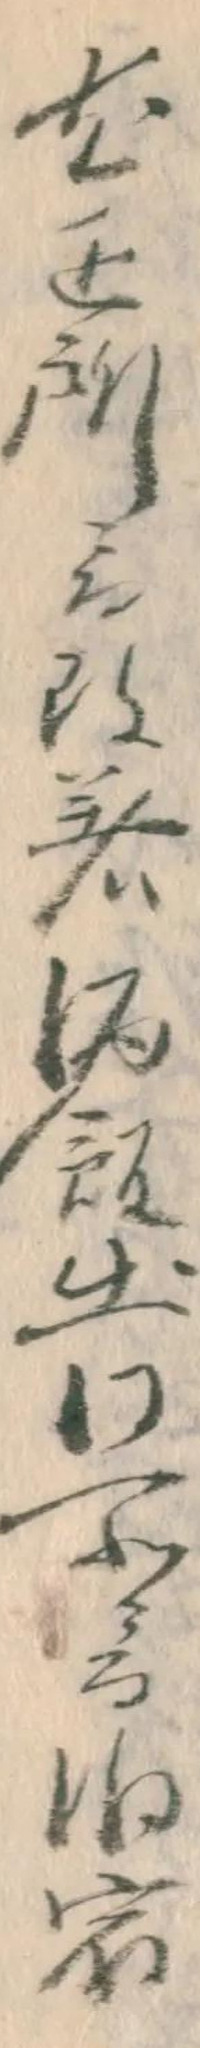尤近所ニ而改着酒飯出同所ニ而泊宿
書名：賀茂社記録. 第66冊
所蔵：国立国会図書館 National Diet Library, JAPAN
